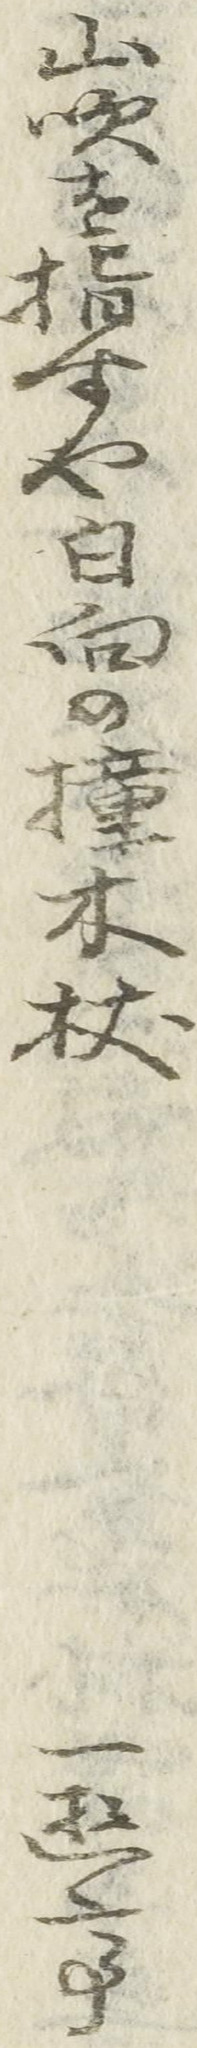山吹を指すや日向の撞木杖一遊亭
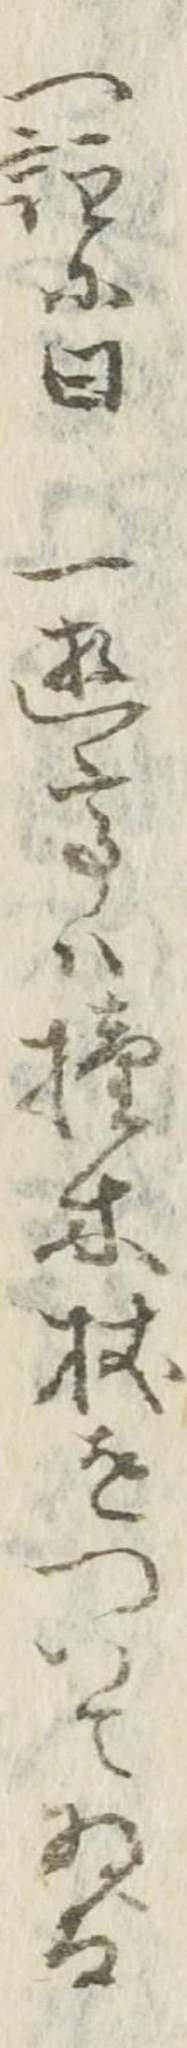（註に曰一遊亭は撞木杖をついてゐる
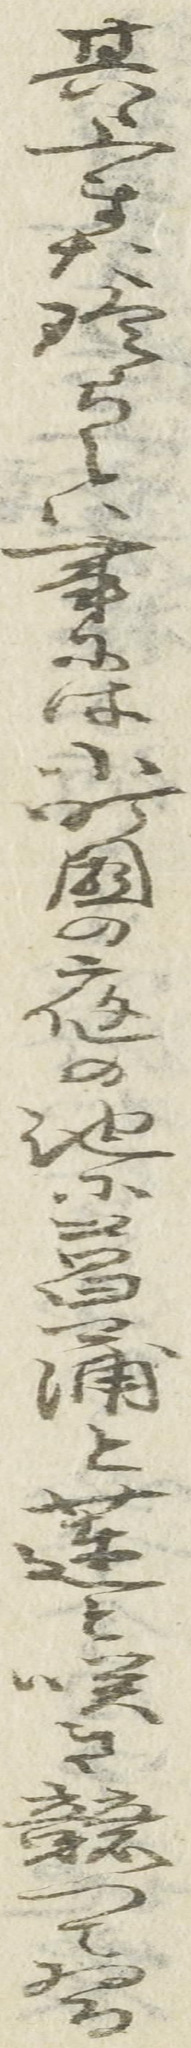其上また珍らしい事には小町園の庭の池に菖蒲と蓮と咲き競つてゐる
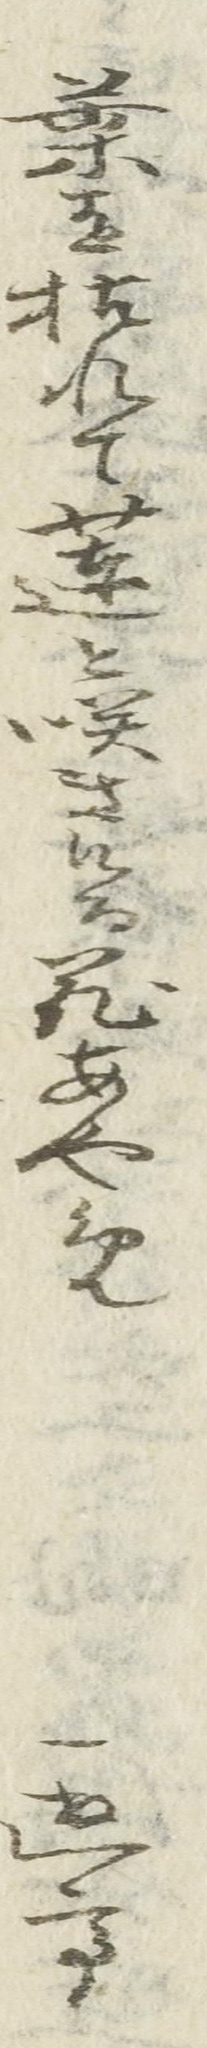葉を枯れて蓮と咲きける花あやめ一遊亭
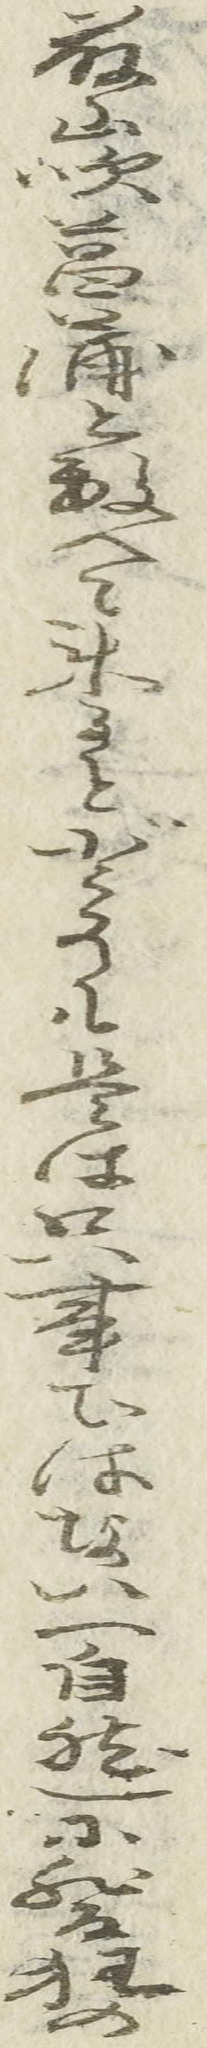藤山吹菖蒲と数えて来るとどうも是は只事ではないに発狂の
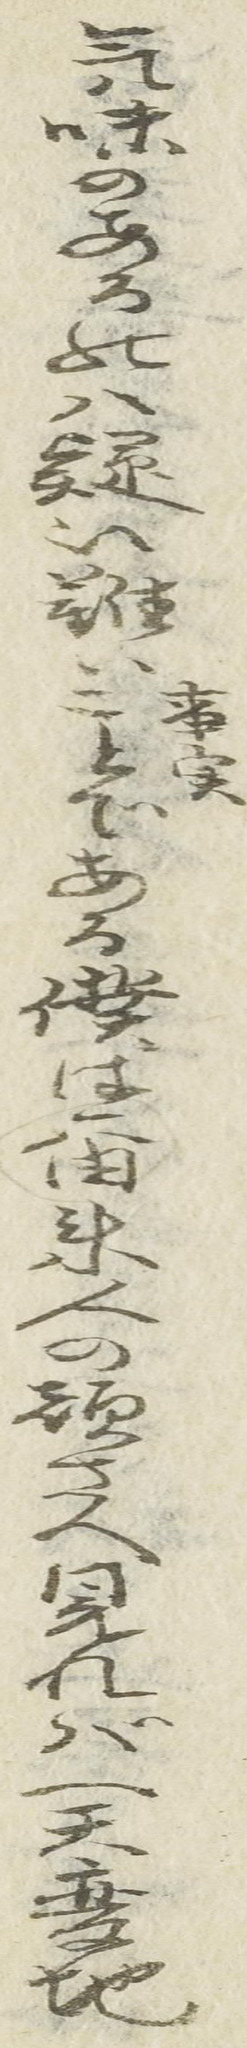気味のあるのは疑ひ難いことである僕は爾来人の顔さへ見れば（天変地
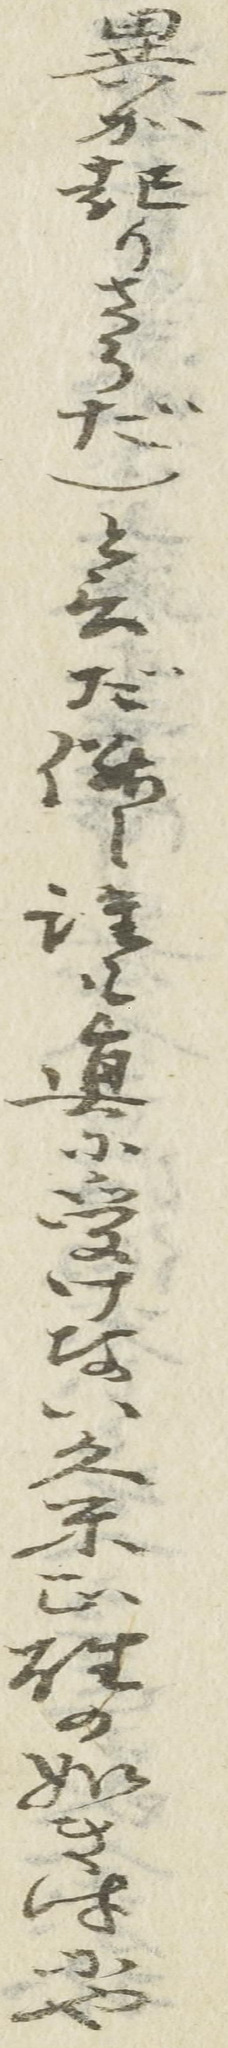異が起りさうだ）と云だ併し誰も真に受けない久米正雄の如きはにや
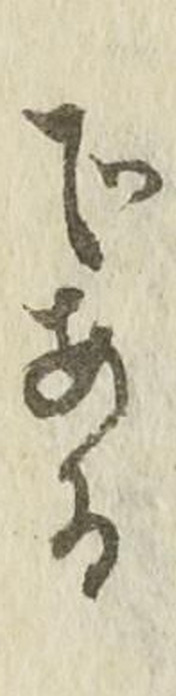である
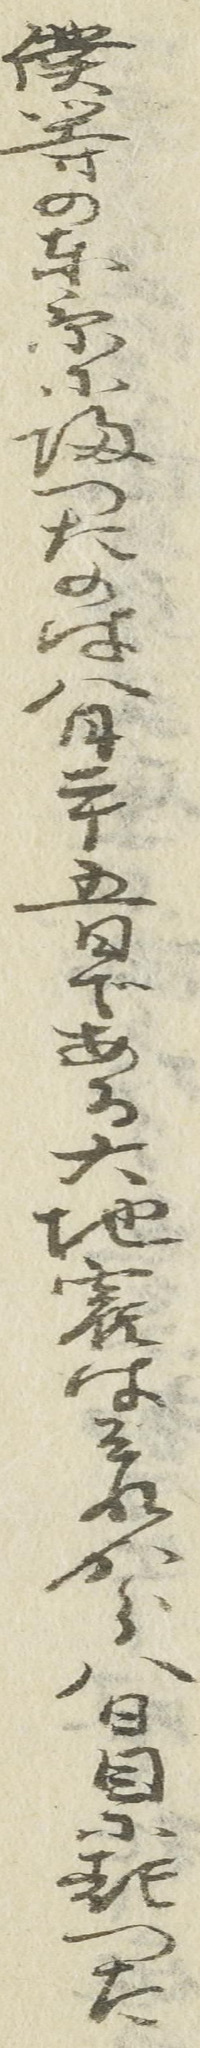僕等の東京に帰つたのは八月二十五日である大地震はそれから八日目に起つた
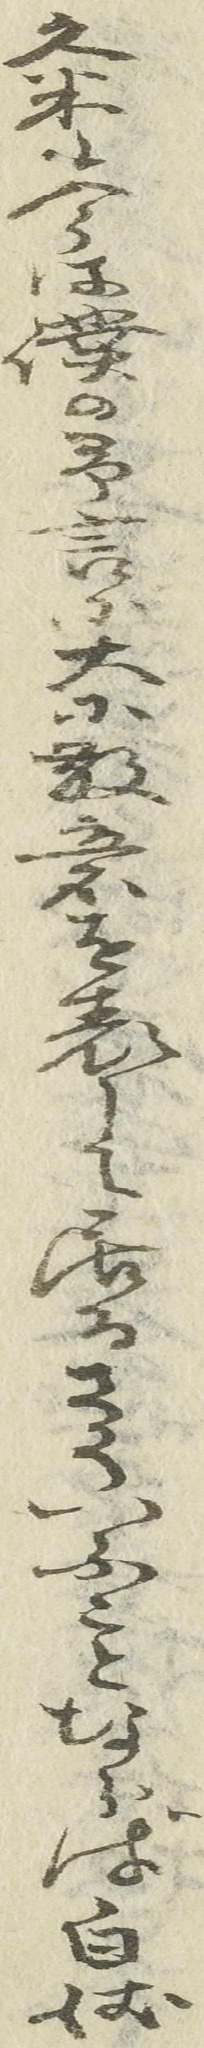久米も今は僕の予言に大に敬意を表して居るさういふことならば白状
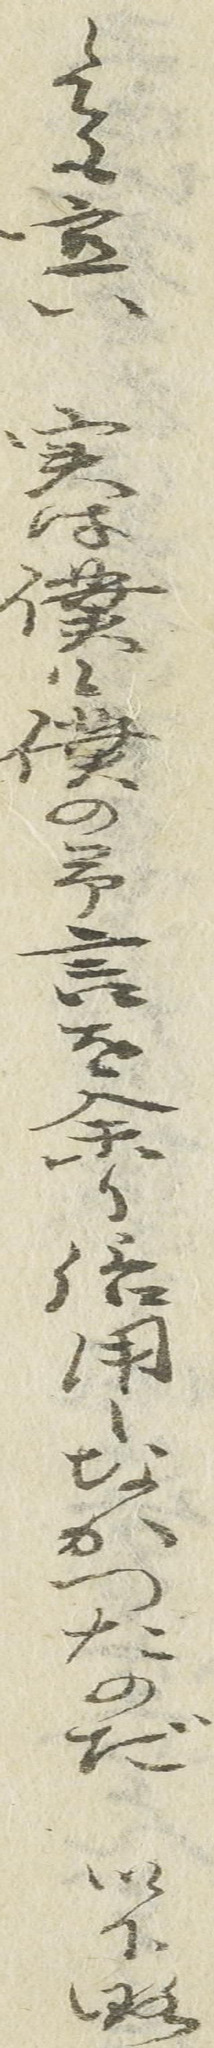しても宜い実は僕も僕の予言を余り信用しなかつたのだ以下略
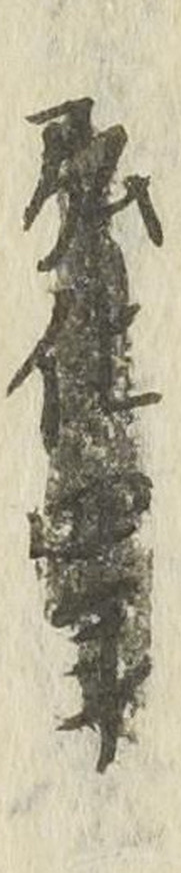弘化四年
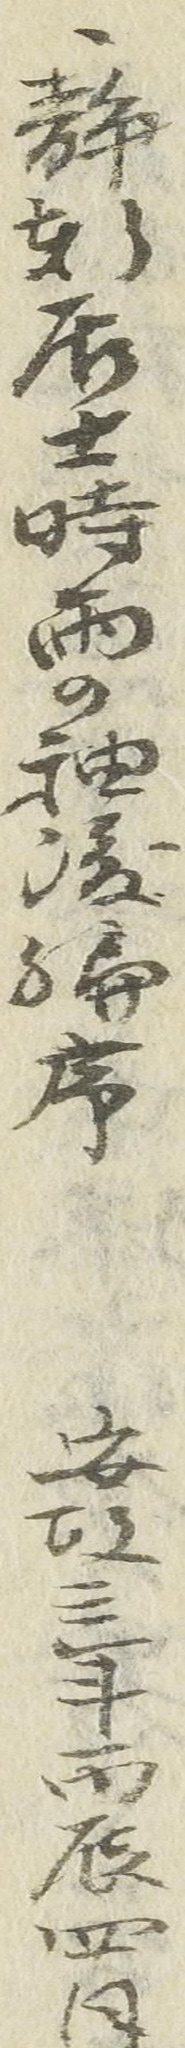一静軒居士時雨の神渡編序安政三年丙辰四月
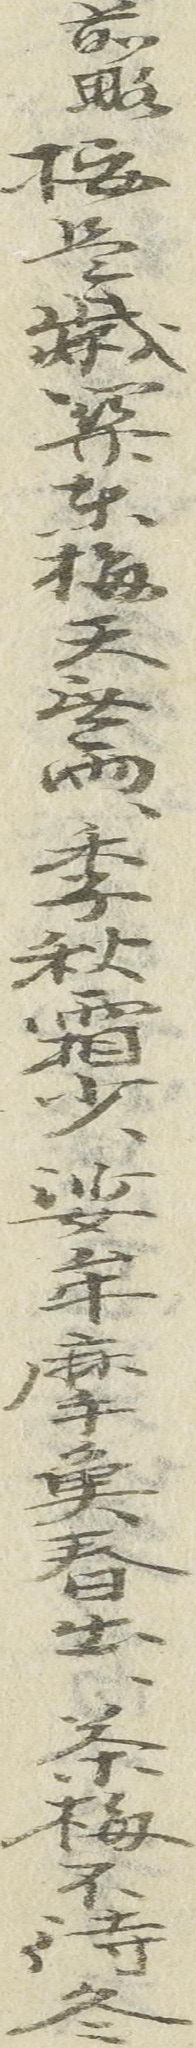前略按是歳関東梅天無雨、季秋霜少、娑牟摩魚春出、茶梅不待冬
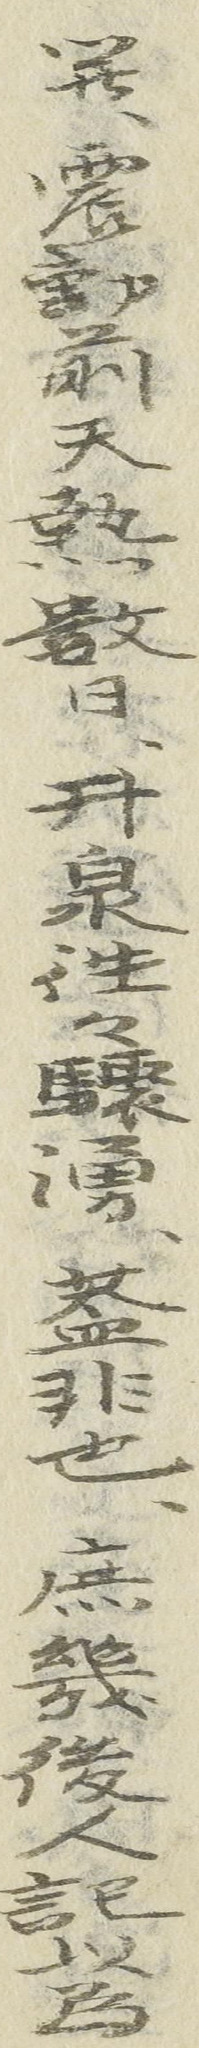開、震動前天熱数日、井泉往々驟湧、蓋非也、庶幾後人記以為
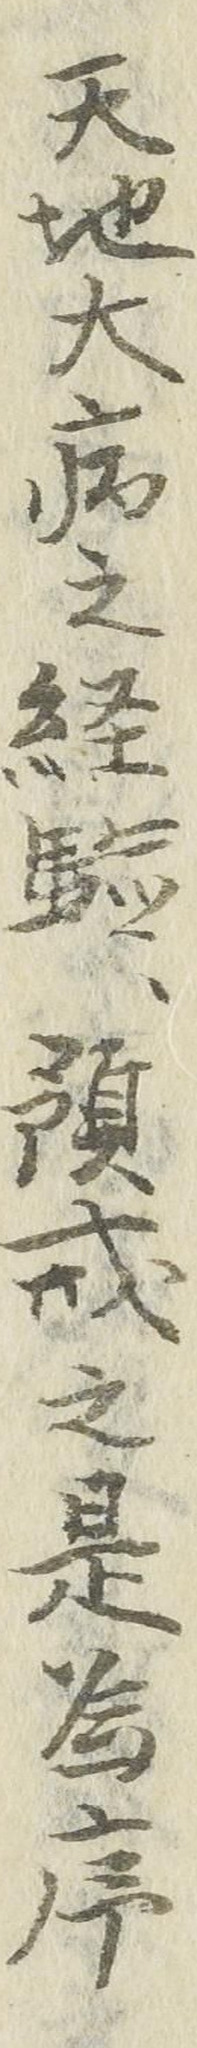天地大病之経験、預戒之是為序
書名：地震前兆集　全
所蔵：東京大学地震研究所図書室 Earthquake Research Institute Library, The University of Tokyo, JAPAN
